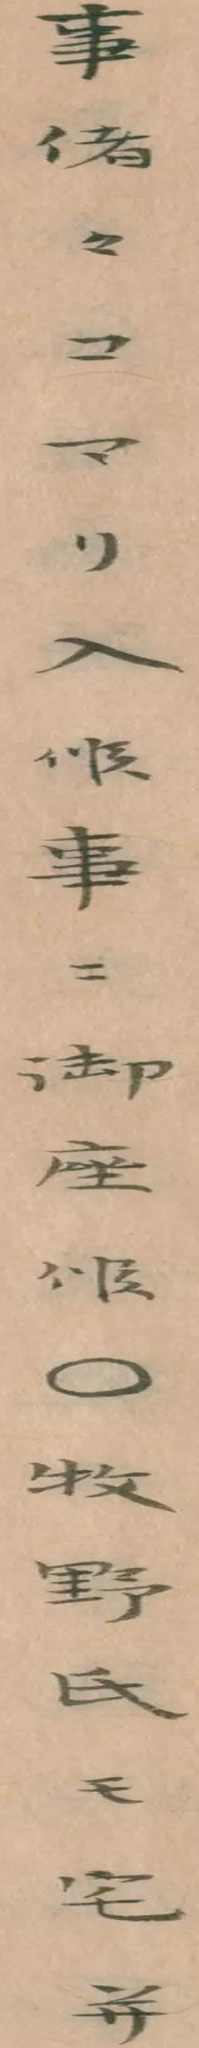事偖々コマリ入候事二御座候〇牧野氏モ宅并
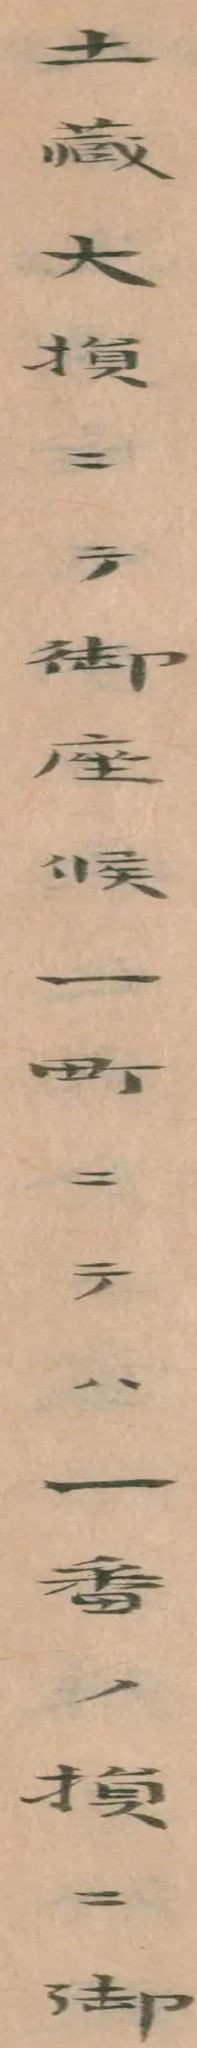土蔵大損ニテ御座候一町二テハ一番ノ損二御
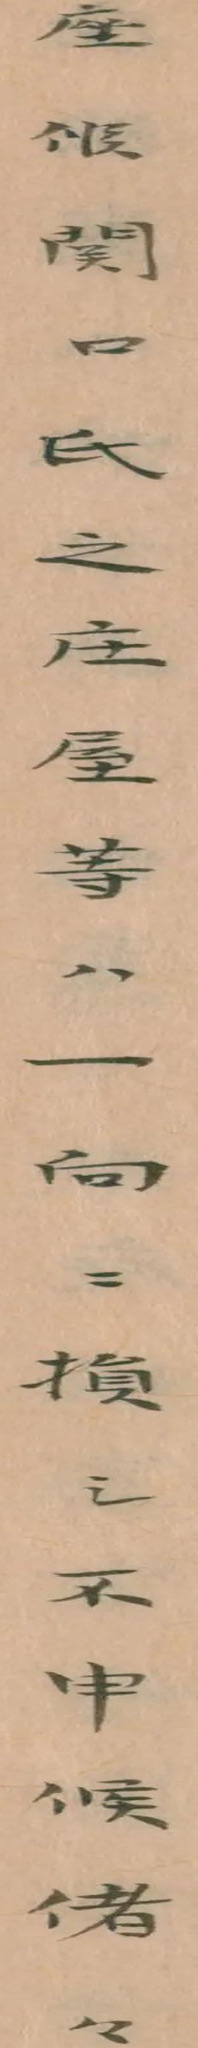座候関口氏之庄屋等ハ一向二損シ不申候偖々
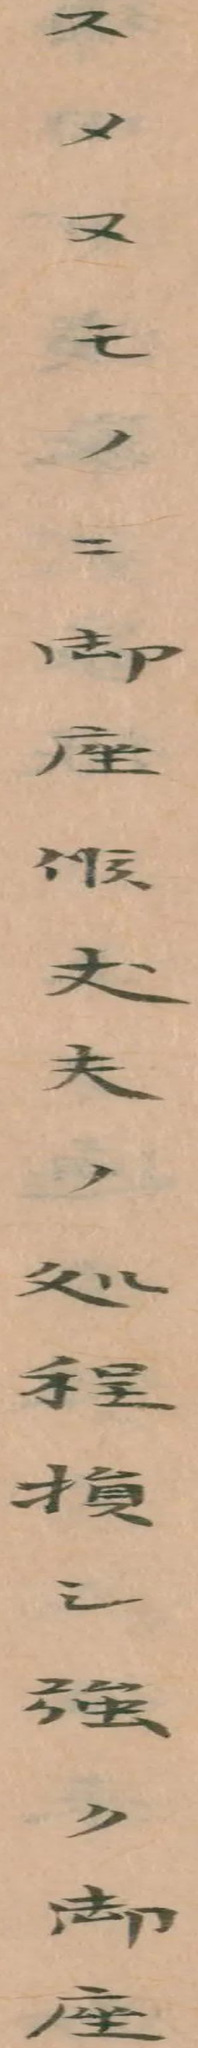スメヌモノニ御座候丈夫ノ処程損シ強ク御座
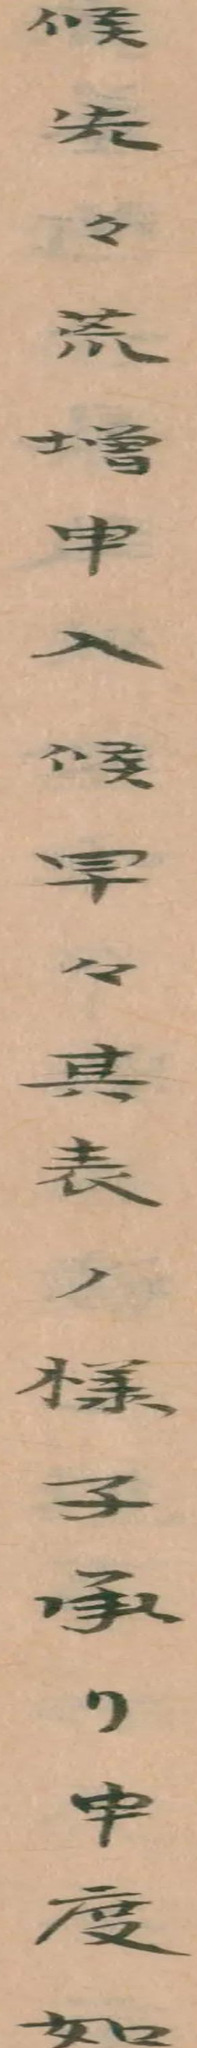候先々荒増申入候早々其表ノ様子承り申度如
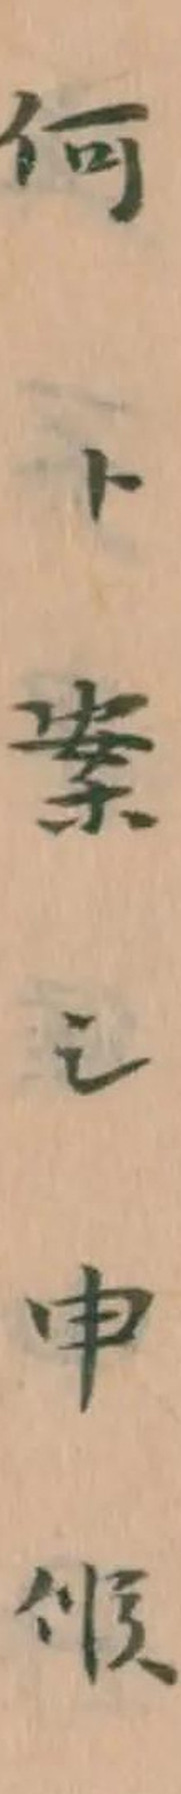何ト案シ申候
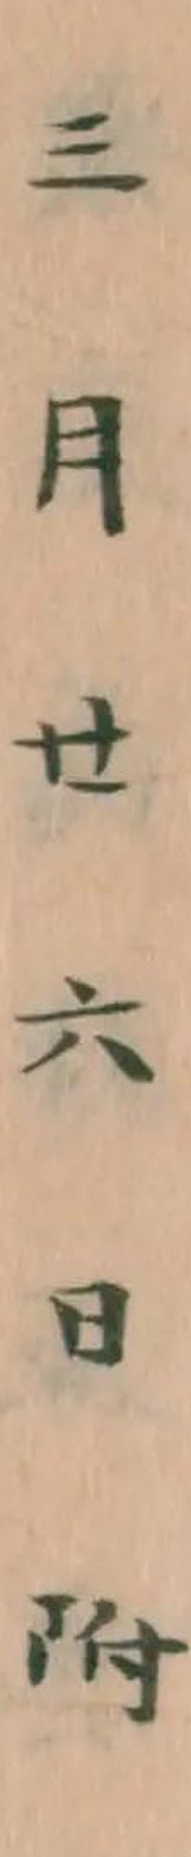三月廿六日附
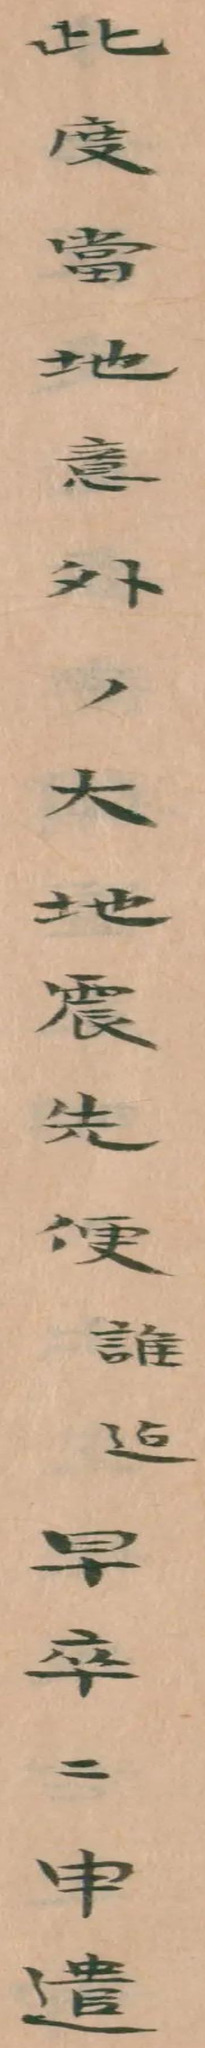此度当地以外ノ大地震先便誰迄早卒二申遣
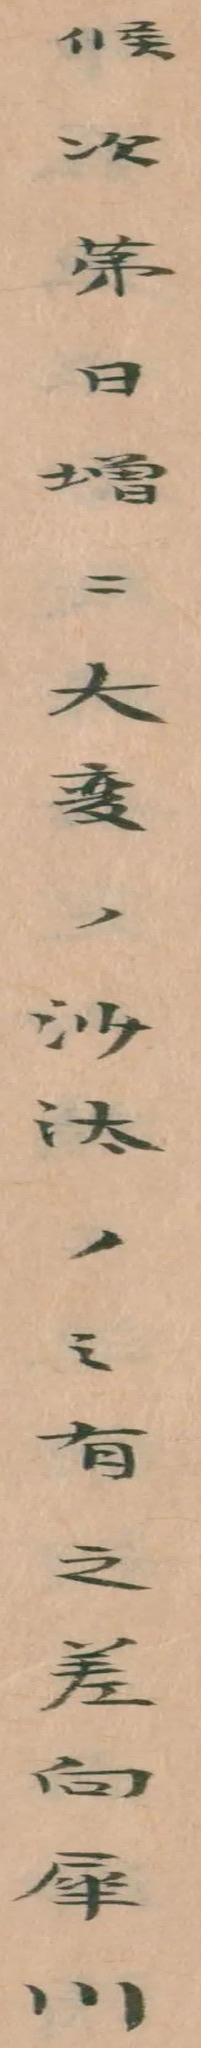候次第日増二大変ノ沙汰ノミ有之差向犀川
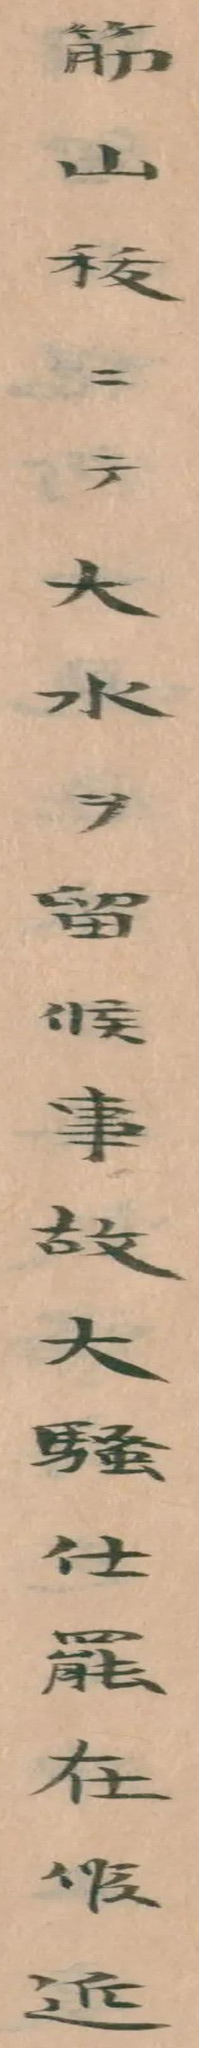筋山抜ニテ大水ヲ留候事故大騒仕罷在候近
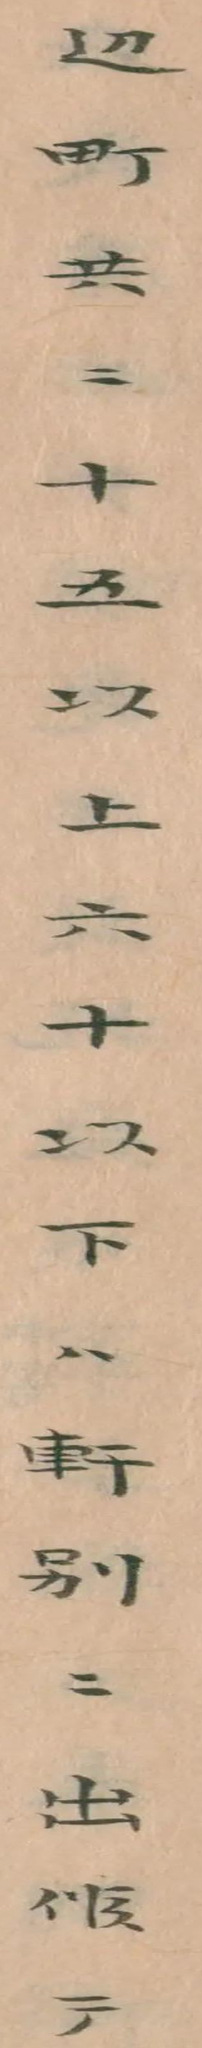辺町共二十五以上六十以下ハ軒別二出候テ
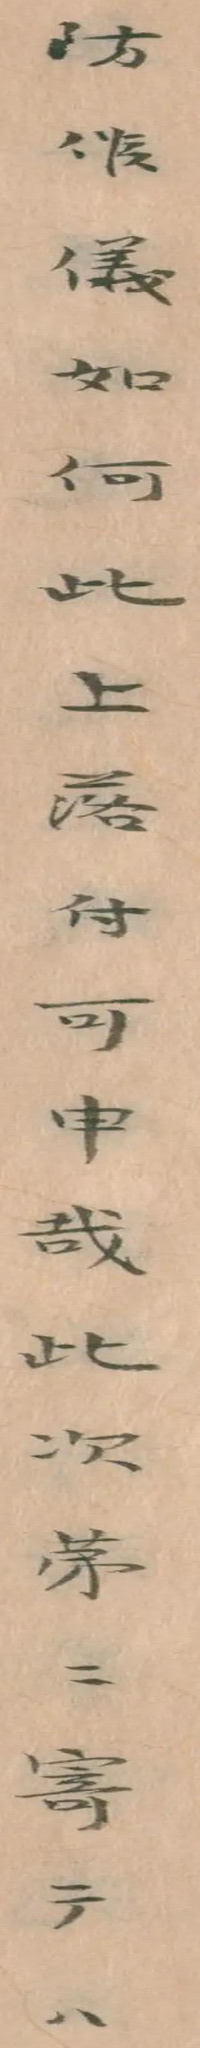防候儀如何此上落付可申哉此次第二寄テハ
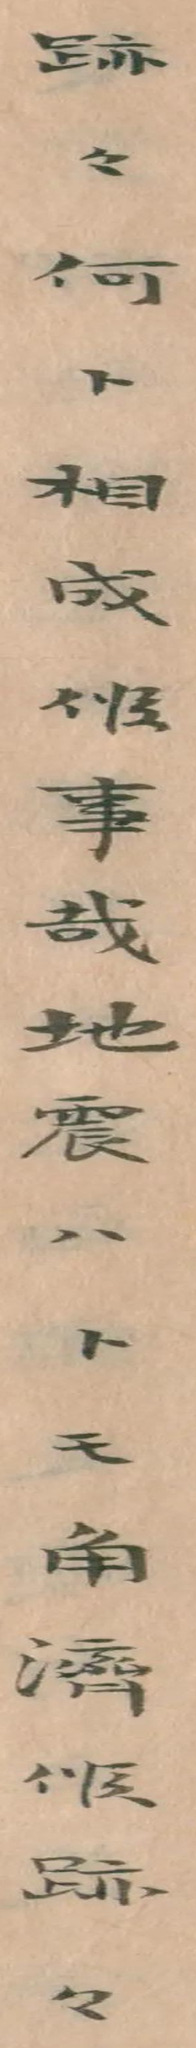跡々何ト相成候事哉地震ハトモ角済候跡々
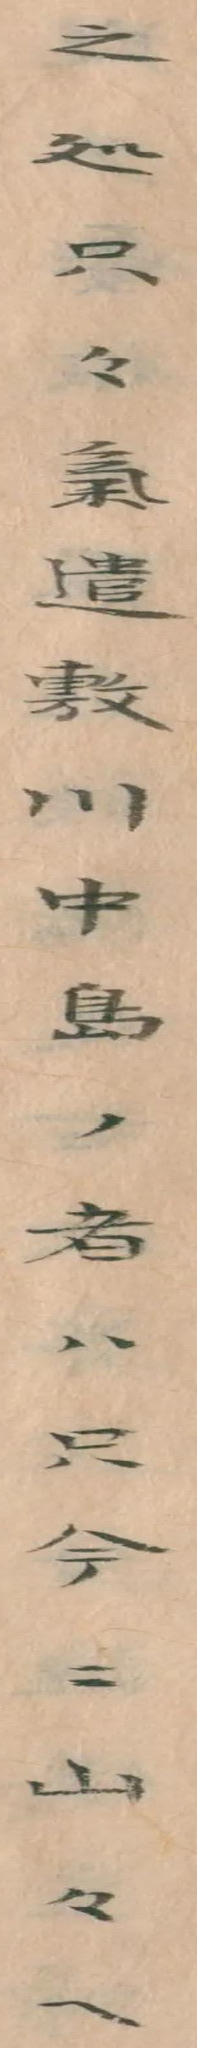之処只々気遣敷川中島ノ者ハ只今二山々へ
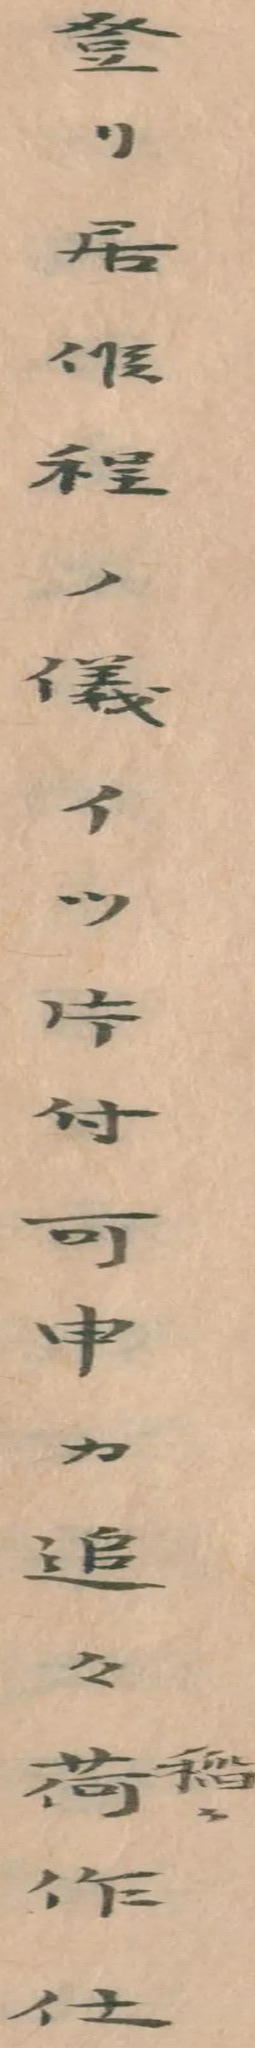登り居候程ノ儀イツ片付可申カ追々稲作仕

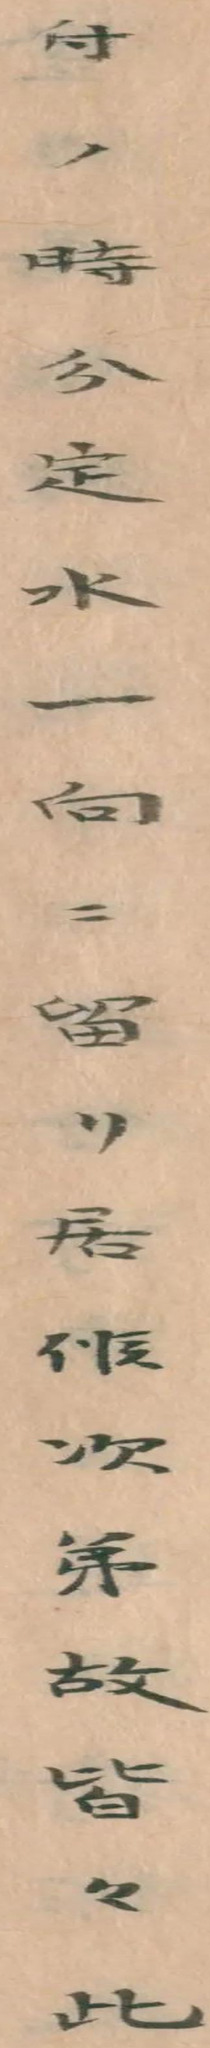付ノ時分定水一向二留り居候次第故皆々此
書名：地災撮要. 巻1(噴火山・地震ノ部)
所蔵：国立国会図書館 National Diet Library, JAPAN
